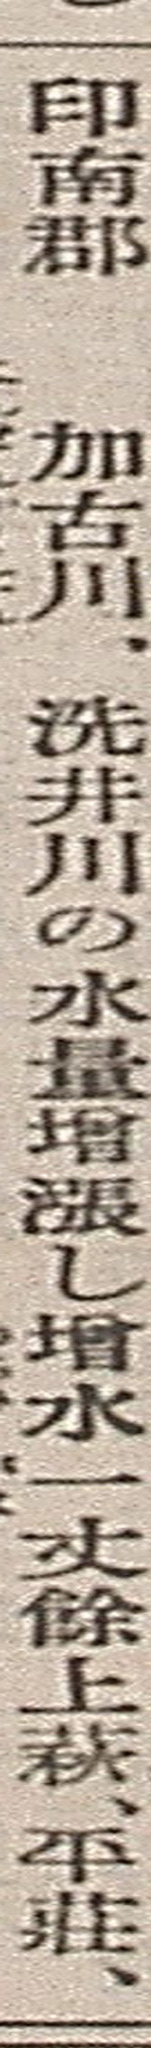印南郡加古川、洗井川の水量増漲し増水一丈餘上萩、平荘、
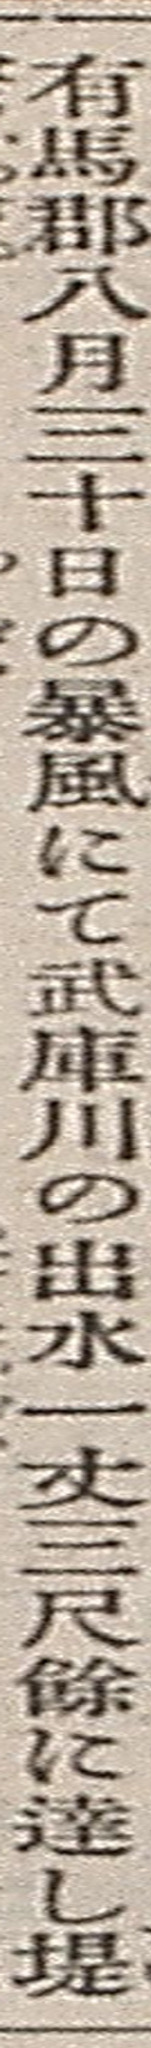有馬郡八月三十日の暴風にて武庫川の出水一丈三尺餘に達し堤
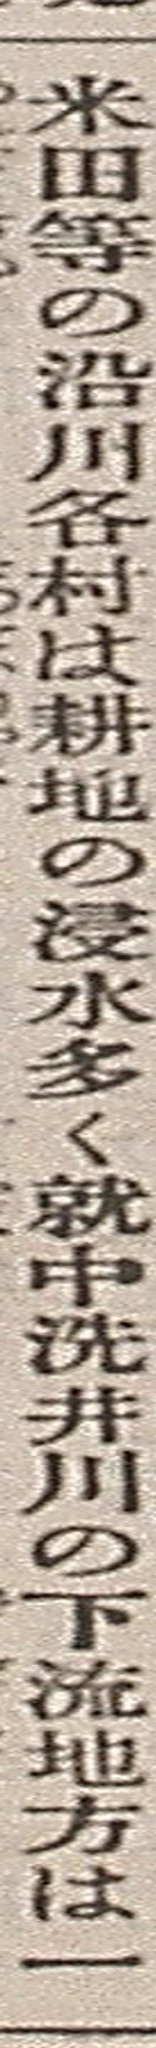米田等の沿川各村は耕地の浸水多く就中洗井川の下流地方は一
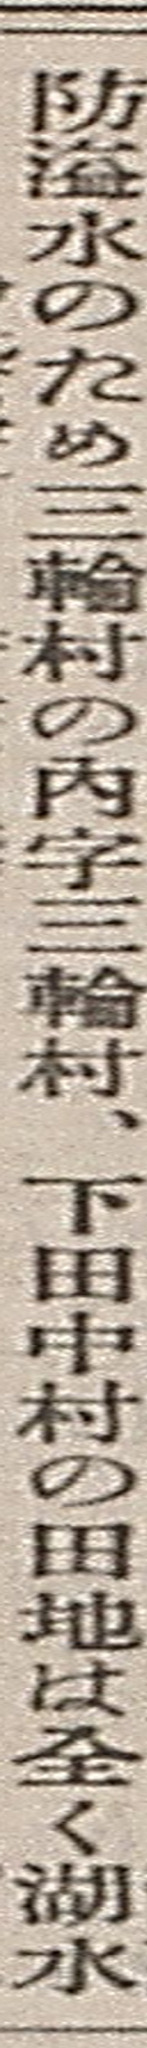防溢水のため三輪村の内字三輪村、下田中村の田地は全く湖水
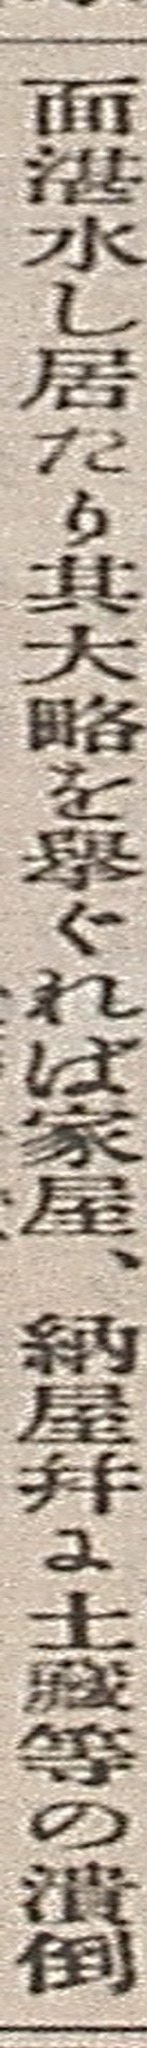面湛水し居たり其大略を挙ぐれば家屋、納屋并に土蔵等の潰倒
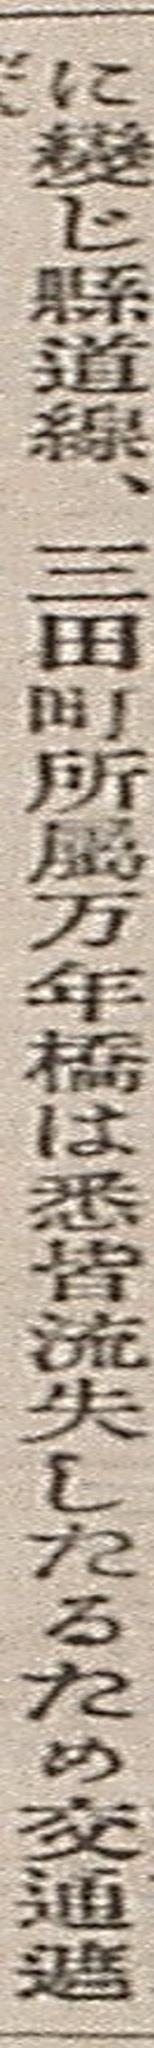に変じ縣道線、三田町所属万年橋は悉皆流失したるため交通遮
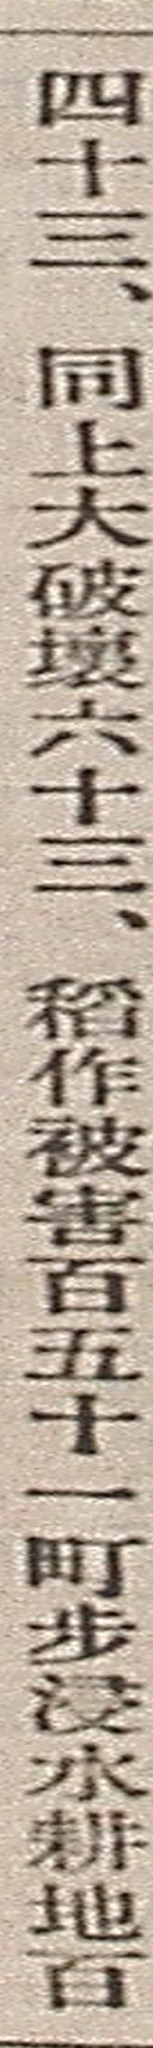四十三、同上大破壊六十三、稲作被害百五十一町歩浸水耕地百
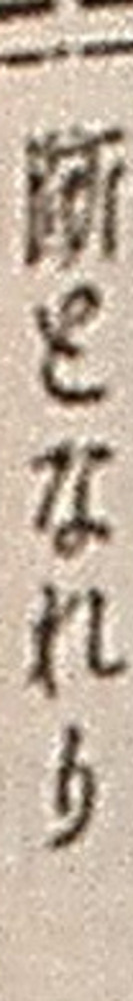断となれり
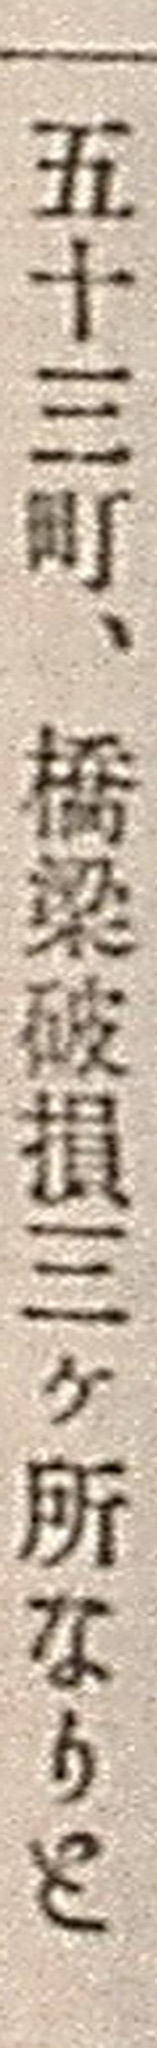五十三町、橋梁破損三ヶ所なりと

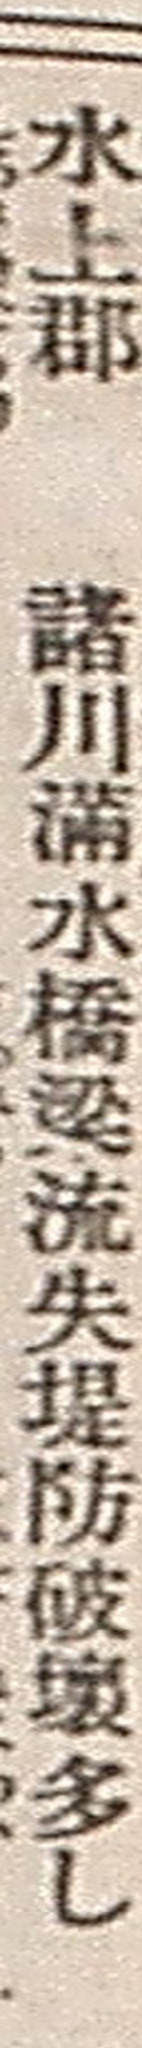水上郡諸川満水橋梁流失堤防破壊多し
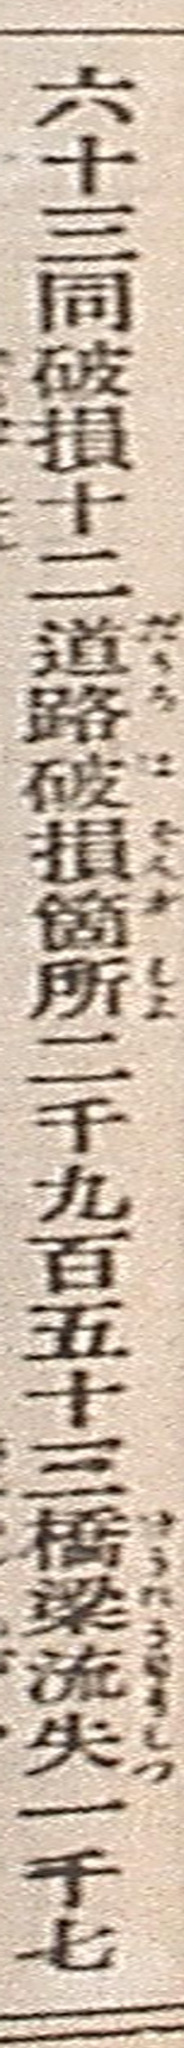六十三同破損十二道路破損箇所二千九百五十三橋梁流失一千七
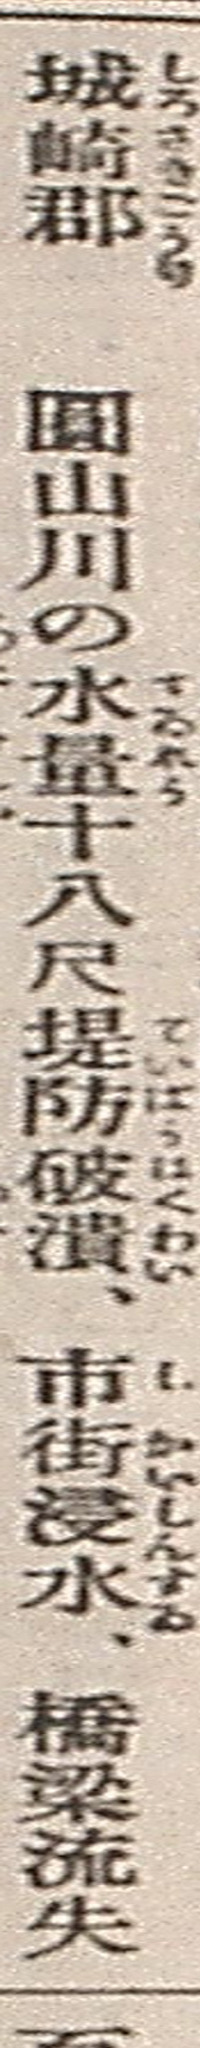城崎郡円山河の水量十八尺堤防破潰、市街浸水、橋梁流失
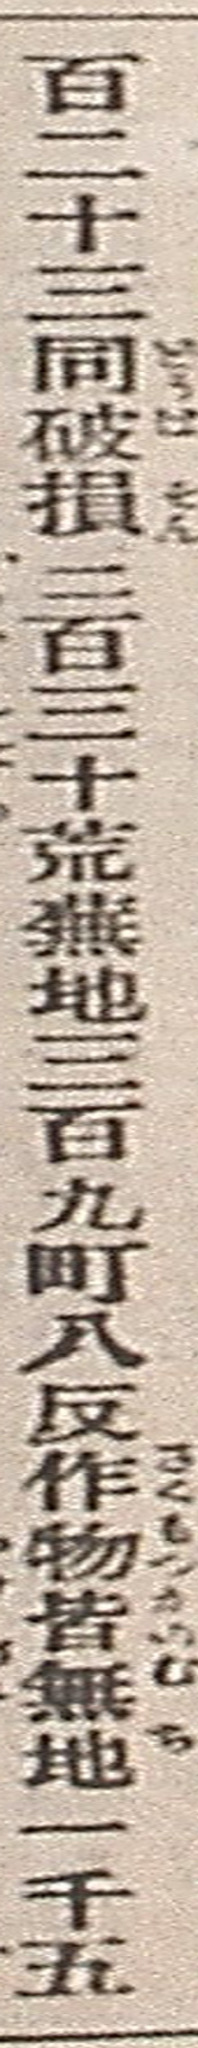百二十三同破損二百三十荒蕪地三百九町八反作物皆無地一千五
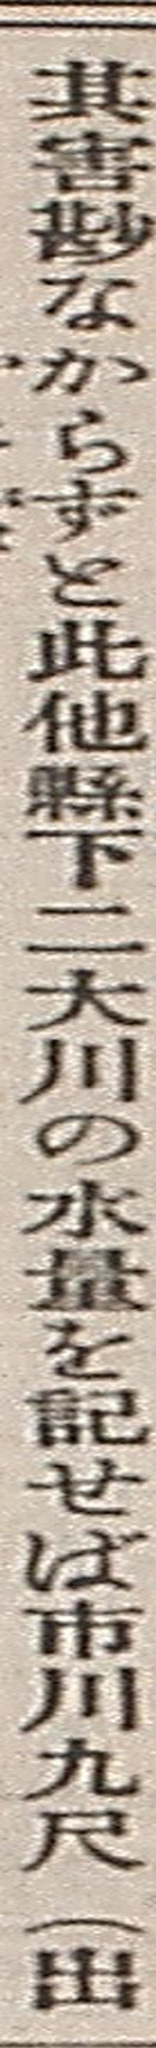其害尠なからずと此他県下二大川の水量を記せば市川九尺（出
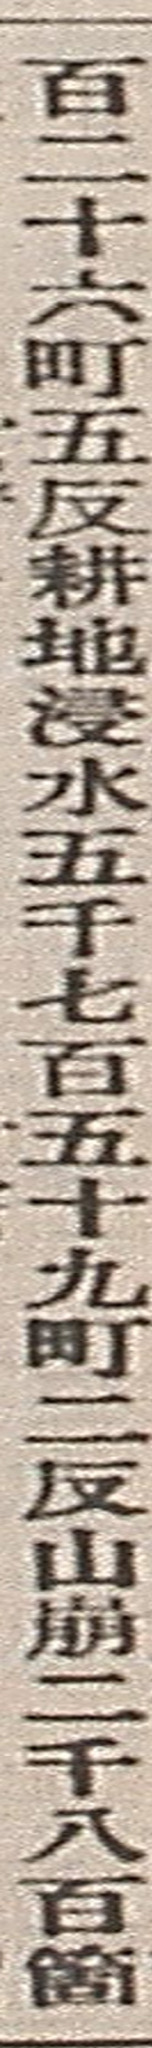百二十六町五反耕地浸水五千七百五十九町二反山崩二千八百箇
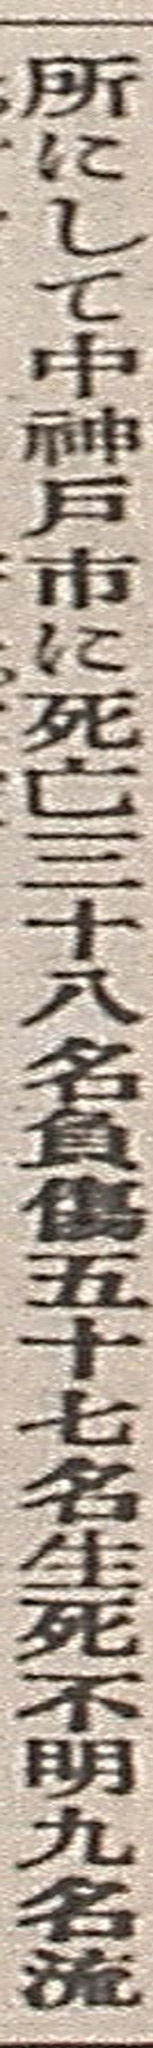所にして中神戸市に死亡三十八名負傷五十七名生死不明九名流
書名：風俗畫報臨時増刊第百二十八號　洪水被害録（下）
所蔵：東京大学地震研究所図書室 Earthquake Research Institute Library, The University of Tokyo, JAPAN
